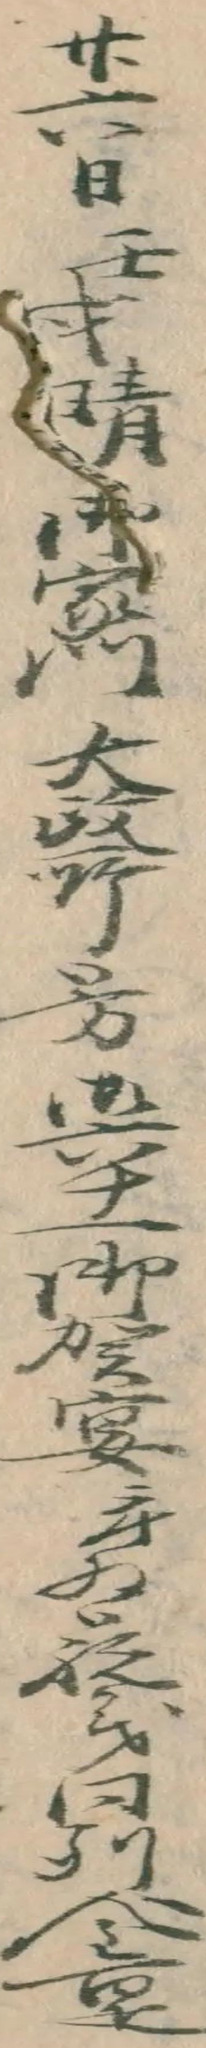廿六日壬戌晴御家門大政所御方御六十一御賀宴ニ付為御祝義同列金百疋
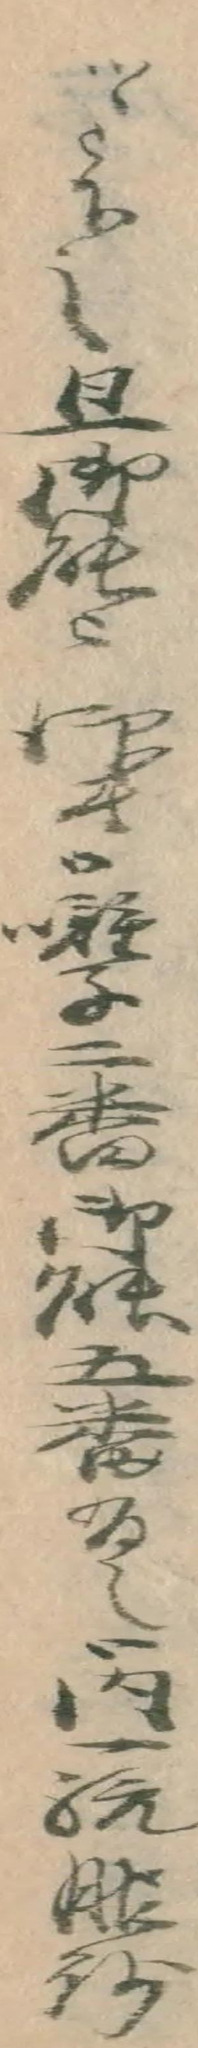ツヽ被下之且御能被仰付御囃子二番御能五番有之御内一統服紗

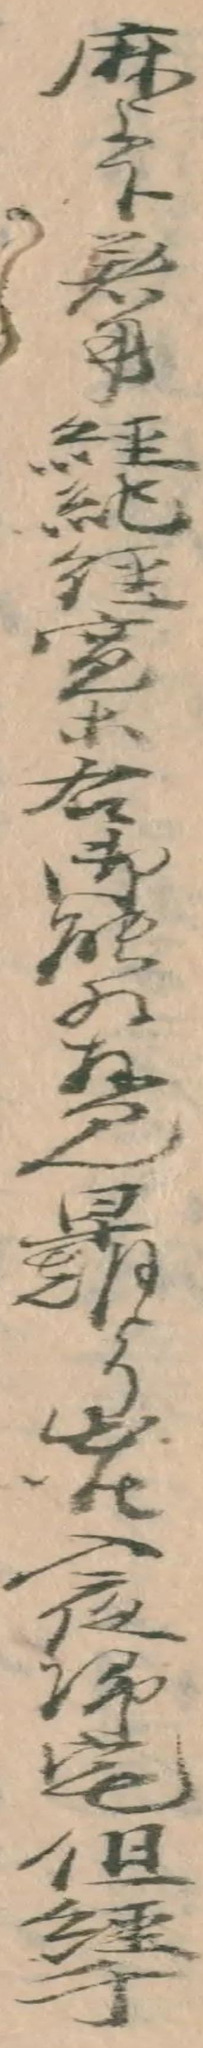麻上下着用経紀経寛等右御能為拝見早朝より出共入夜帰宅但経千
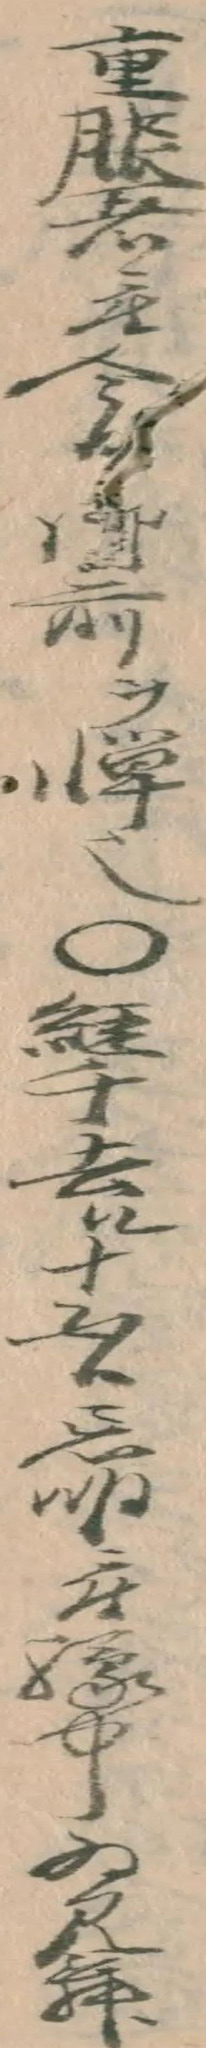重服着ニ付今前を憚也○経千去ル十五日忌明ニ付中為見舞
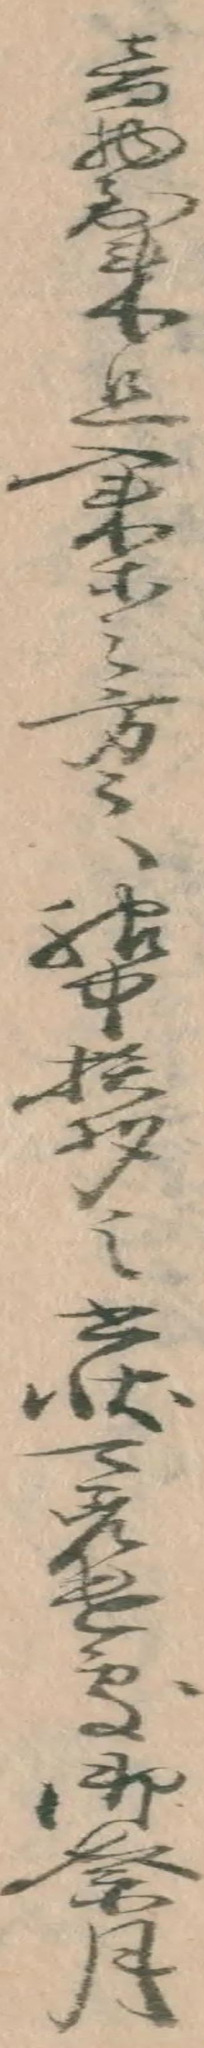音物到来且入来等之方々へ中挨拶之書状可差遣候處御祭月
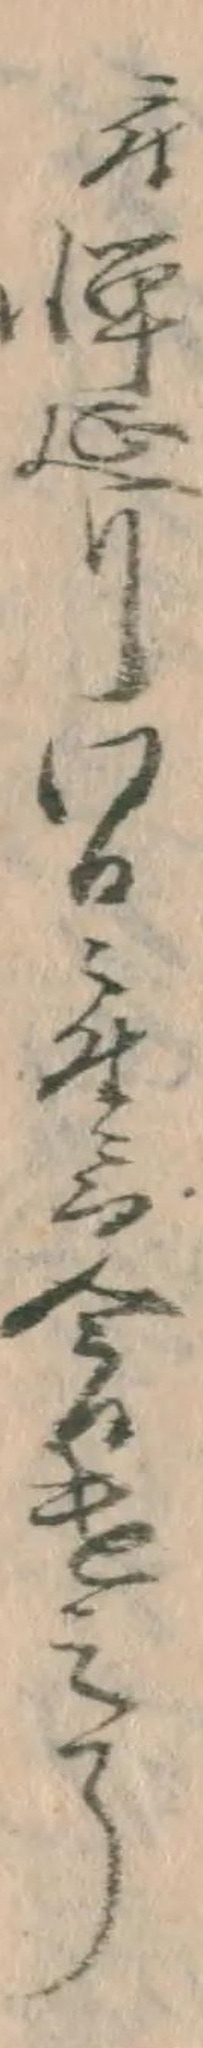ニ付憚延引同日ニ付ニ而今日遣之了
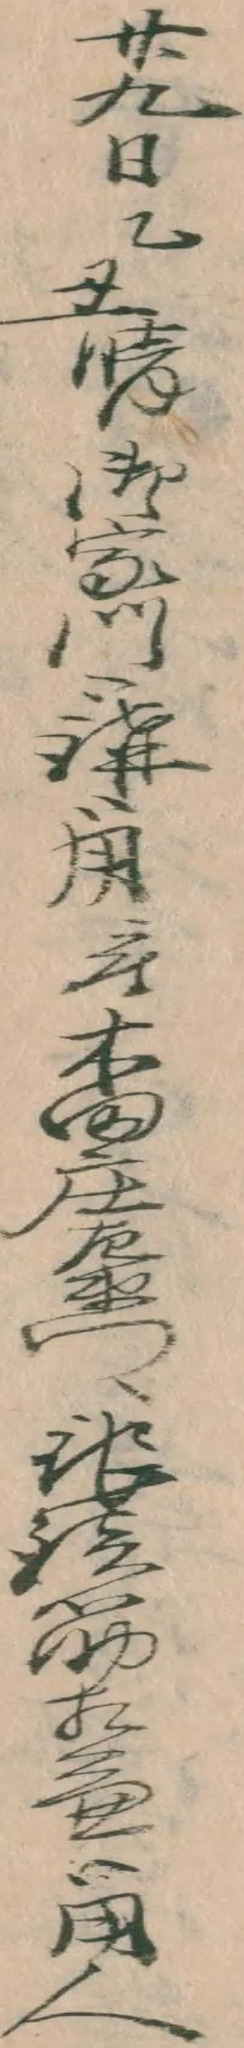廿九日乙丑晴御家門御講御用ニ付木田庄左衛門へ銀談筋相兼御用人
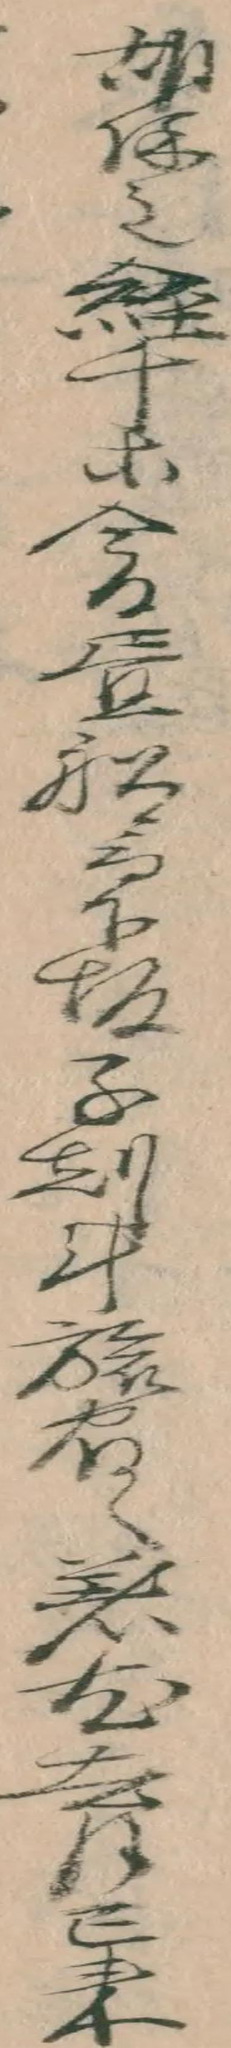胡保之経千等今日昼舩ニ而下坂子刻斗旅有之着尤去月已来
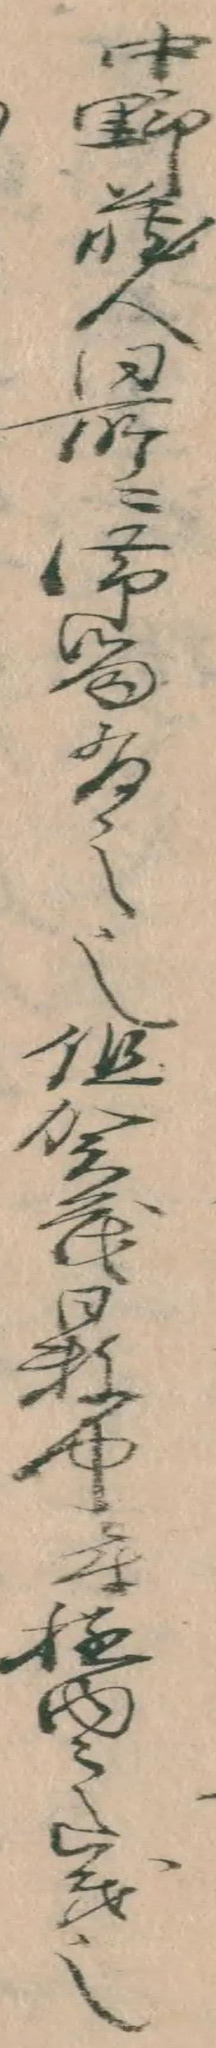中野蔵人同所に滞留有之也但賀茂日数中ニ付極内々之義也
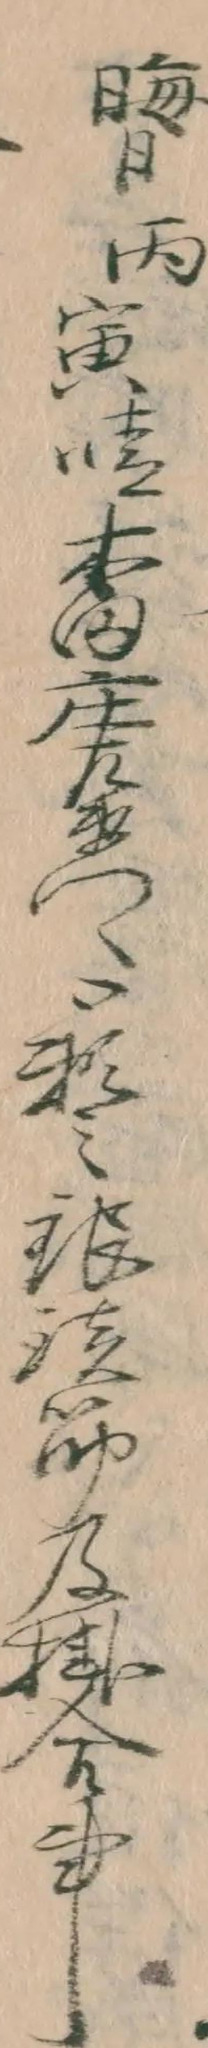晦日丙寅晴木田庄左衛門へ御頼之銀談筋及掛合事
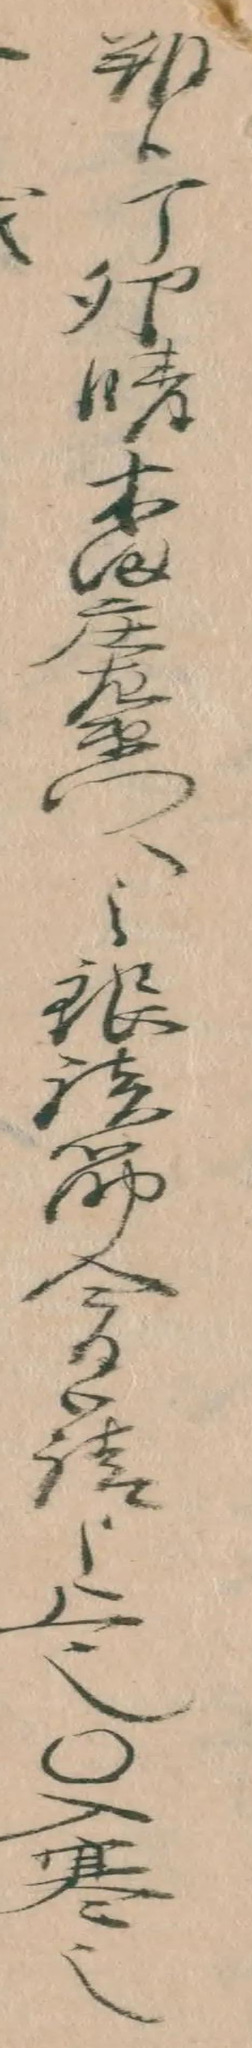一朔日丁卯晴木田庄左衛門へ之銀談筋今日御請申上也○入寒也
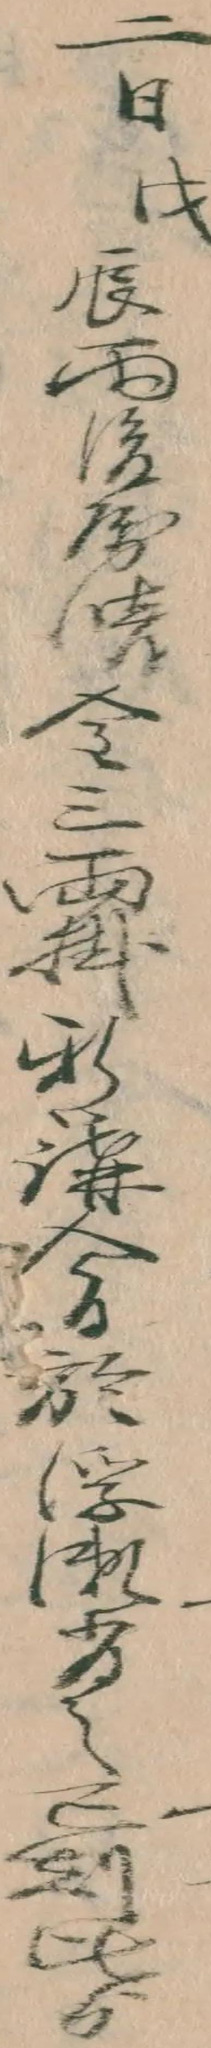二日戊辰雨後属晴金三両掛新講今日於浮瀬有之巳刻比ゟ
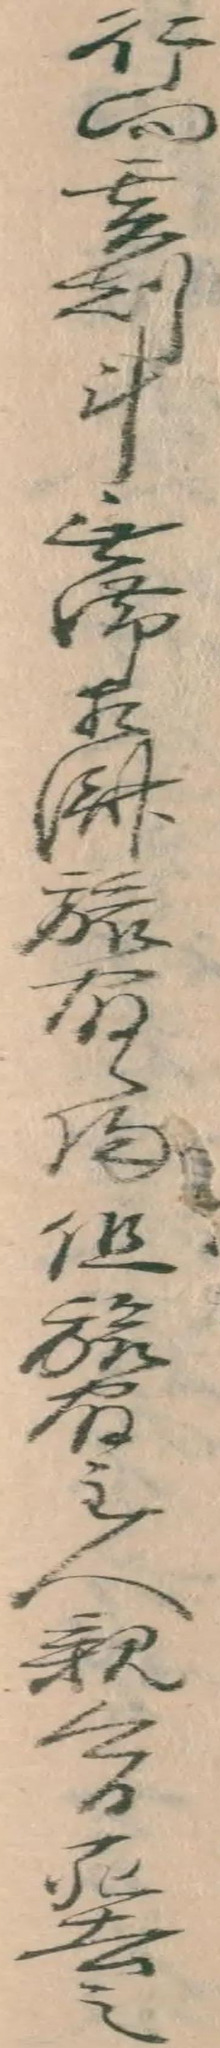行向亥刻斗無滞相済旅宿ヘ帰但旅宿主人親今日死去之
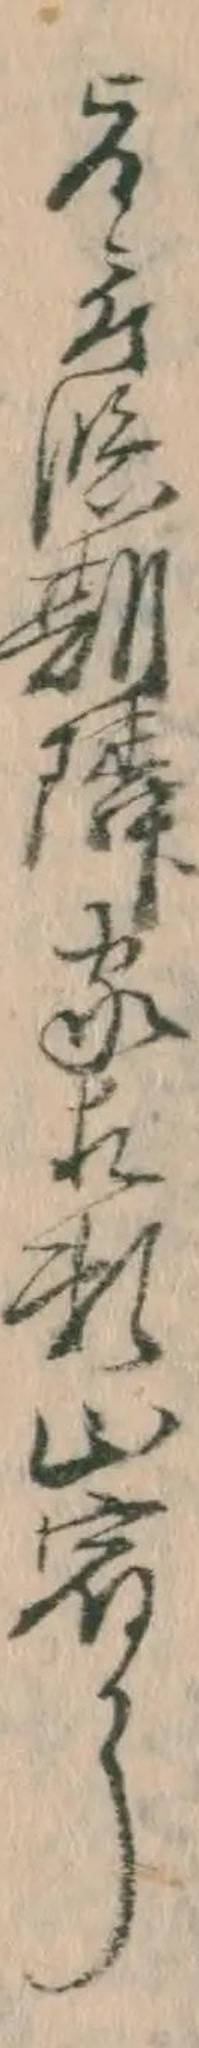旨ニ付臨期障家相頼山宿了
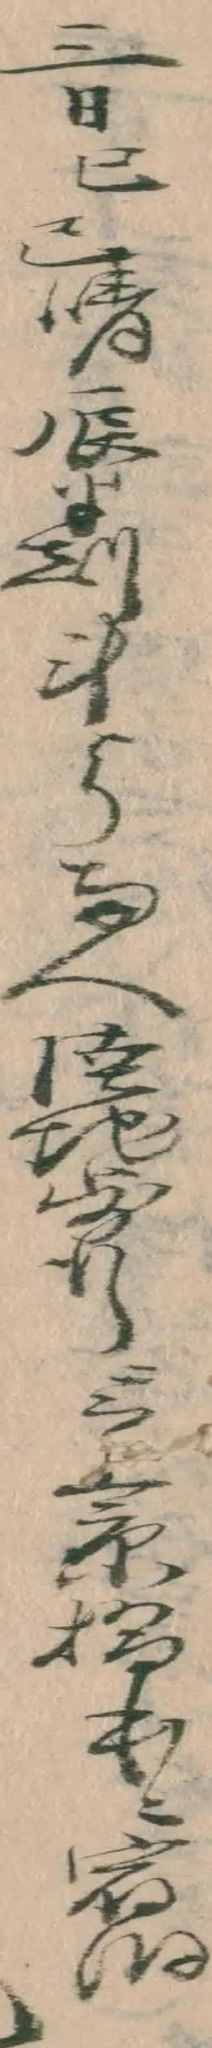三日己巳晴辰半刻斗より両人陸地歩行ニ而上京橋本二宿泊
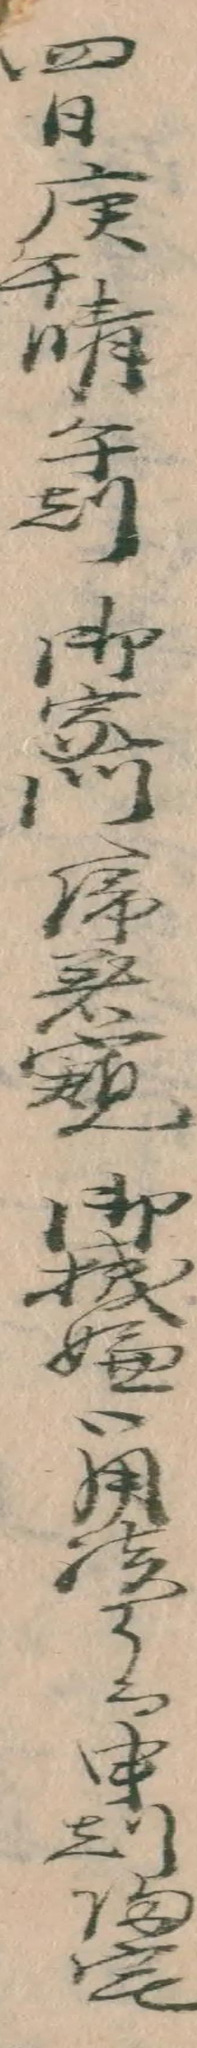四日庚午晴午刻御家門へ帰暑窺御機嫌御用談了而申刻帰宅
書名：賀茂社記録. 第65冊
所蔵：国立国会図書館 National Diet Library, JAPAN
